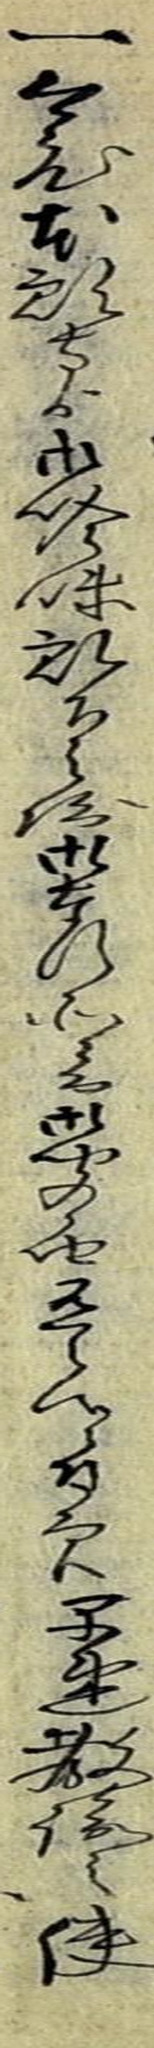一今度本願寺ゟ御吟味願下之儀御奉行所に而御聞由有之候に付而は早速教諭之使
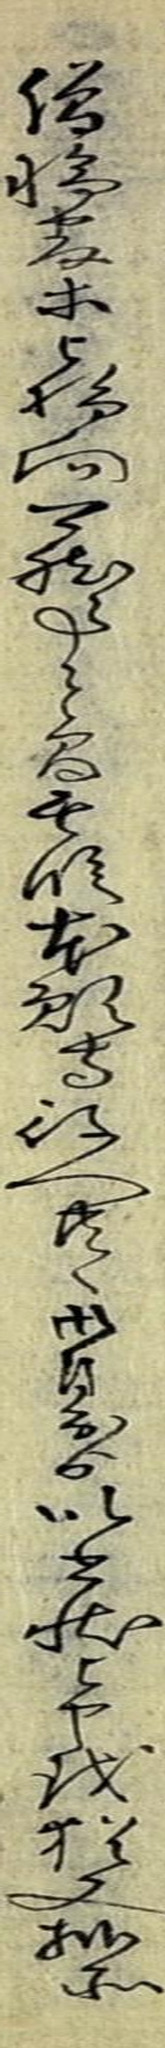僧輪番等被指向可然事に候間其段本願寺役人共へ御自分ゟ以書状被申越猶又掛所
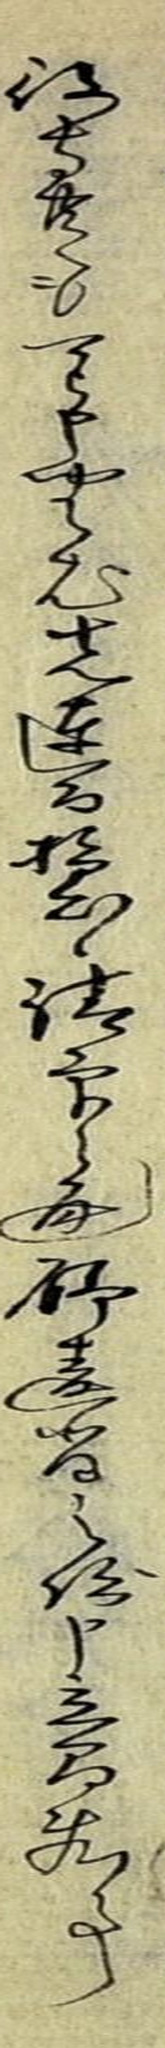役寺共へも可被申聞尤先達而指出候請印之通聊違背之儀申立間敷事
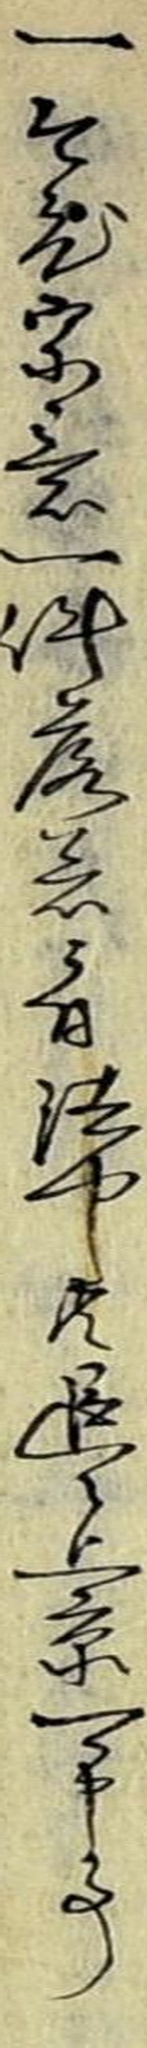一今度宗意一件落着に付法中共追々上京可申事
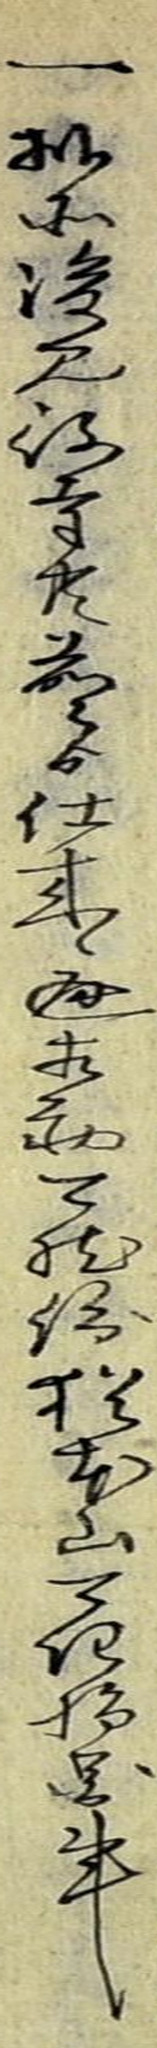一掛所後見役寺共前々ゟ仕来候通相勤可然儀猶本山可任指図事
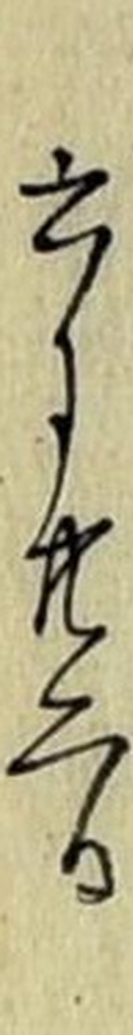六月廿二日
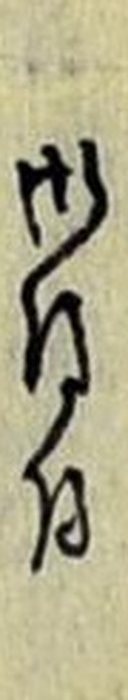御目付
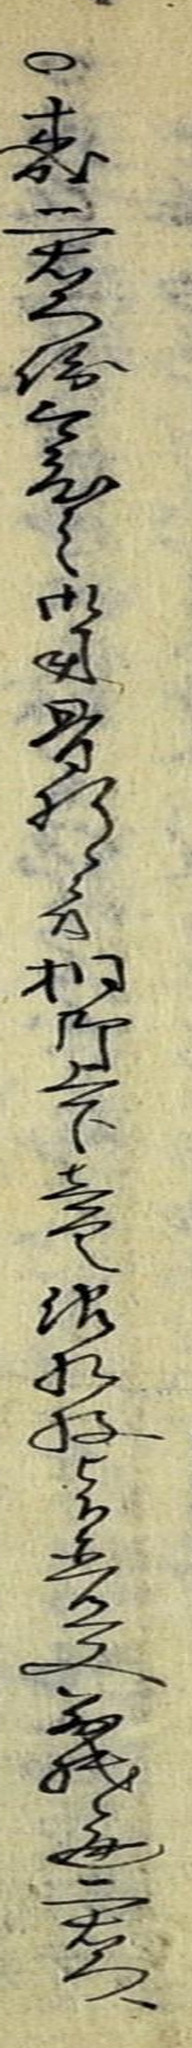○森二右衛門儀今度之御用骨折候に付桐御上下壱具銀拾枚被下置且又別紙之通二右衛門へ
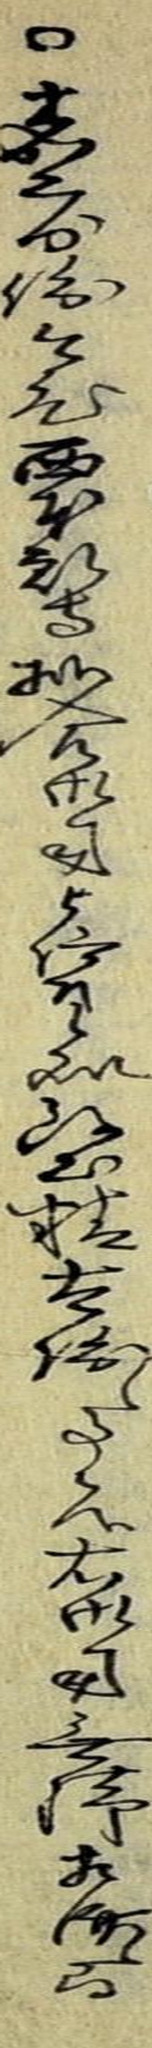○森二右衛門儀今度西本願寺掛合御用被仰付候処致出精太儀候事に候右御用無滞相済候間
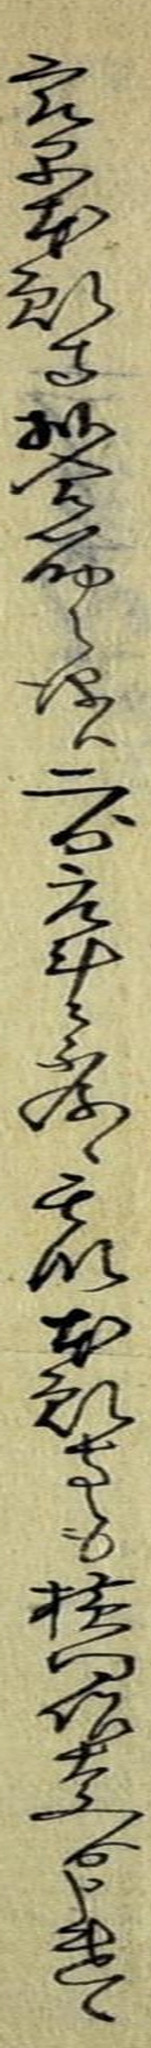最早本願寺掛合筋之儀は二右衛門取斗に不及候其段本願寺も横田作太夫ゟ申遣候
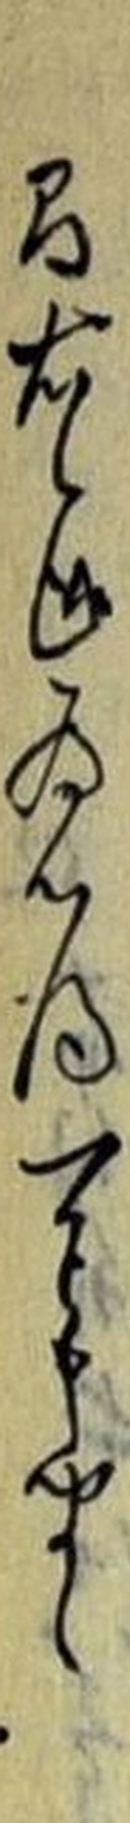間右之趣為心得可被申聞候
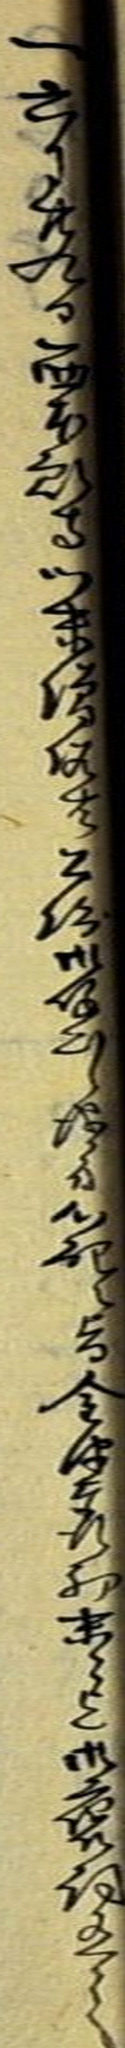一六月廿九日西本願寺門末僧俗共公儀御呼出之儀に付心配之旨金津奉行初末々迄御褒詞有之
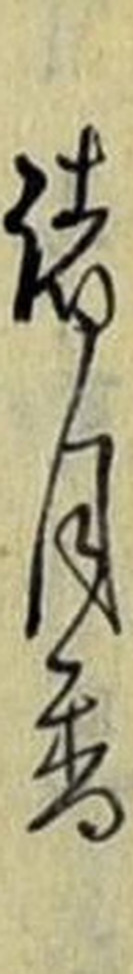諸月番
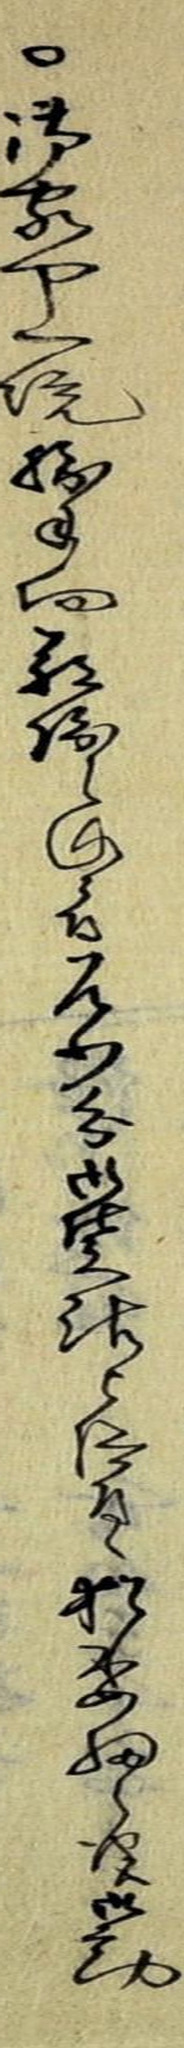○御家中一統勝手向難儀之趣に付乍少分御貸銀被仰付候猶委細之儀は御勘
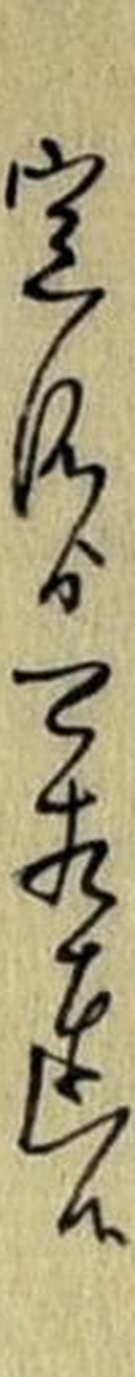定所ゟ可相達候
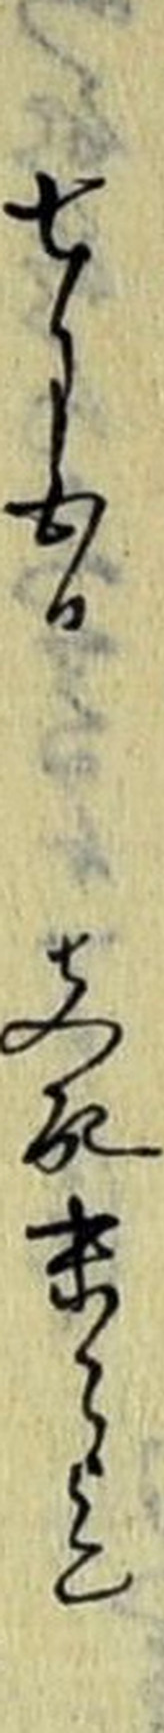七月五日支配末々迄
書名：命令之部 四
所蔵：福井県文書館 Fukui Prefectural Archives
